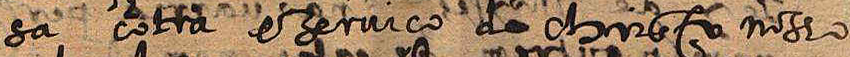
sa cōtra e seruiço de christo nosso
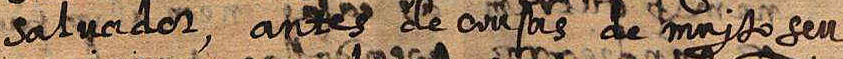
Saluador, antes de cousas de mujto seu
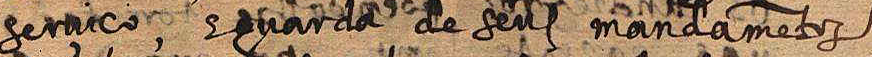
seruiço, E guarda de seus mandamētos
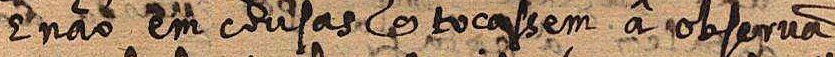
E não em cousas q̄ tocassem â obseruā
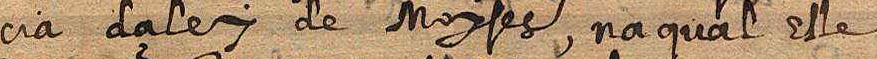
cia da ley de Moyses, na qual Elle
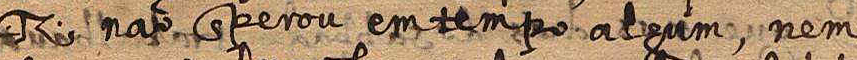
R. naõ sperou em tempo algum, nem
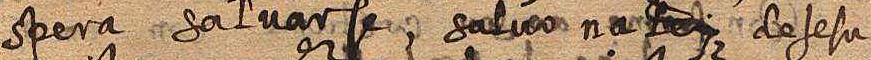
spera saluarse, saluo na ley de Jesu
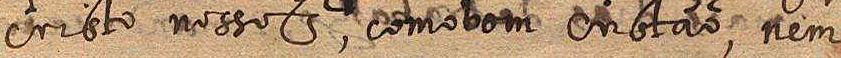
cristo nosso sor, como bom cristaõ, nem
